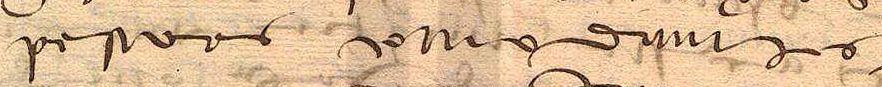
pessoas como dantes
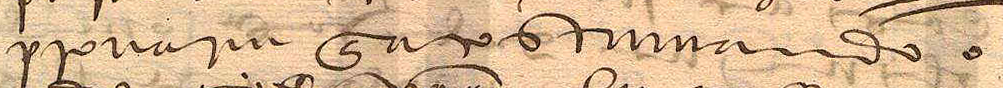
prouara q̄ acostumando o
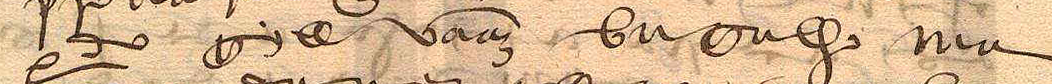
Ldo gyll vāaz bagalho ma
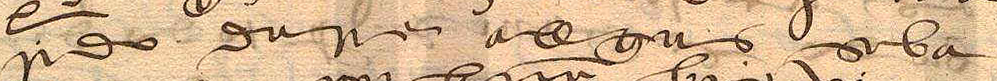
rido da rre allgus saba
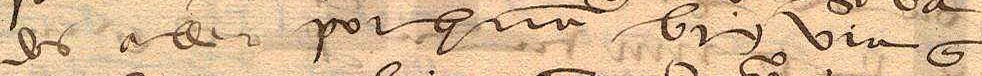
dos a ller por huā bryvia q̄
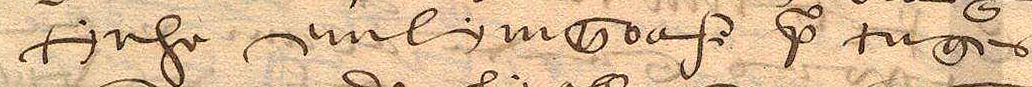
tynha em lymgoaJē p̄otuges
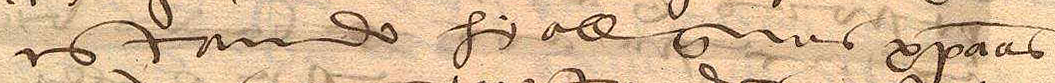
estando hy allguus xpaõs
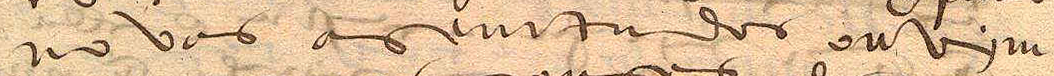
novos asemtados ouvym
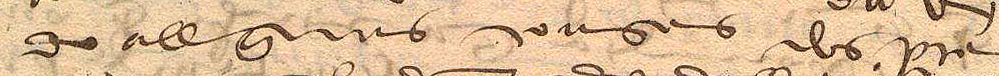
do allguas cousas dos pre
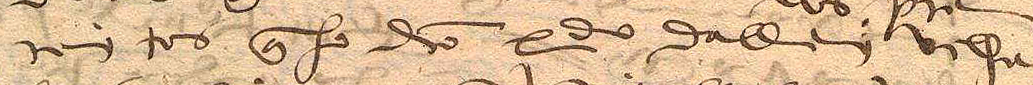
ceytos q̄ ho dt̄o Ldo da lley velha
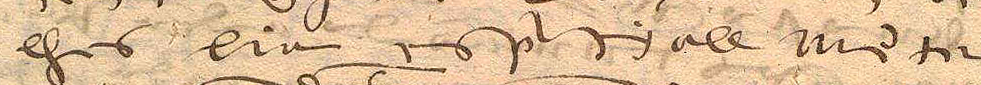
lhes lia espicyallmēte
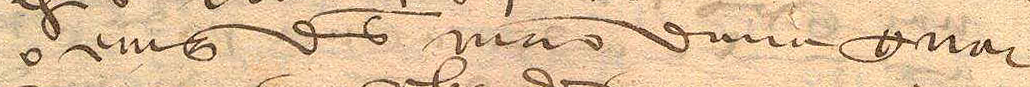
o em q̄ ds̄ mãodaua guar
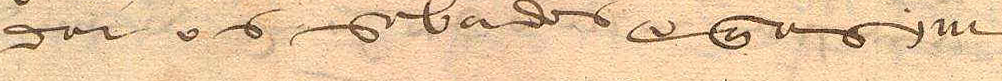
dar os sabados e q̄ asym
